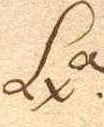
Lx.a
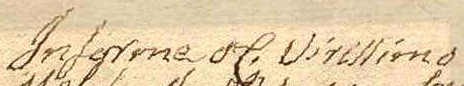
Informe o C. Virissimo
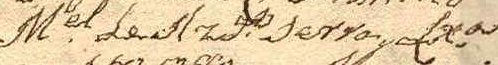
M.el de Azd.o serra, Lx.a
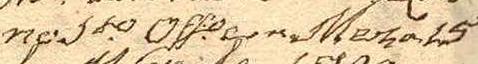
no s.t.o Off.o em Meza 15
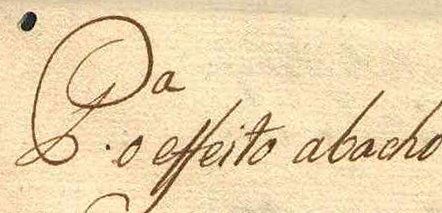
P.a o effeito abacho
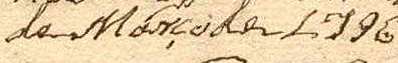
de Março de 1796
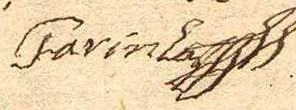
Farinha
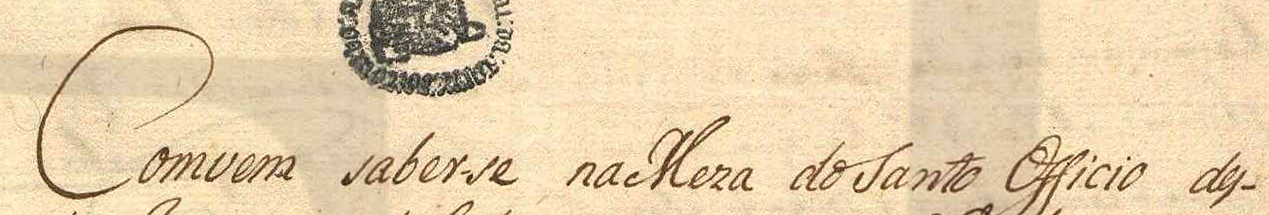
Comvem saber-se na Meza do Santo Officio des
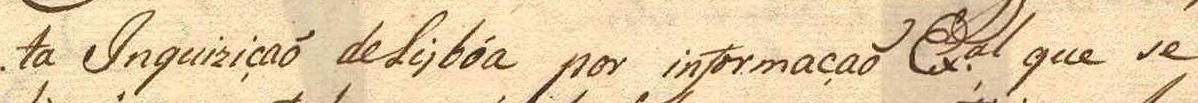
ta Inquiziçaõ de Lisbóa por informaçaõ Ex.al que se
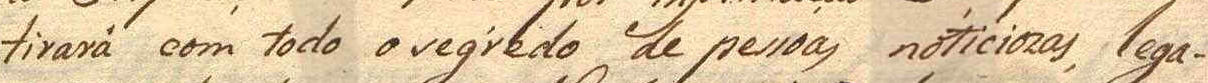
tirará com todo o segredo de pessoas noticiozas, lega
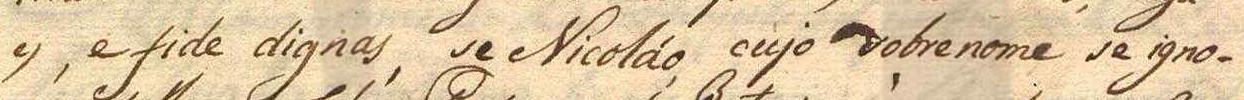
is, e fidedignas, se Nicoláo, cujo sobrenome se igno
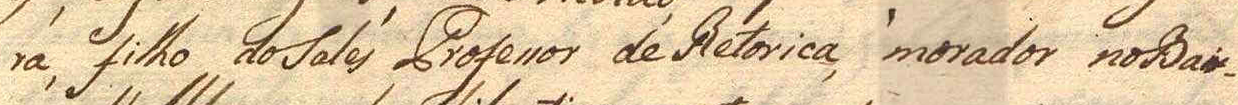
ra, filho do Sales Professor de Retorica, morador no Bair
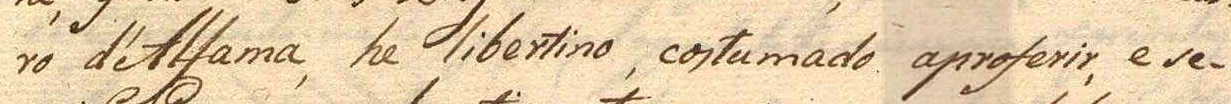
ro d'Alfama, he libertino, costumado a proferir, e se
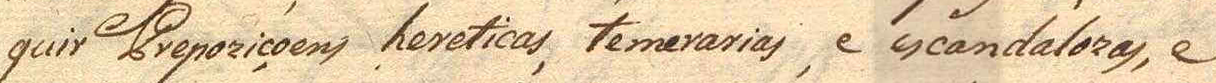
guir Prepoziçoens hereticas, temerarias, e escandalozas, e
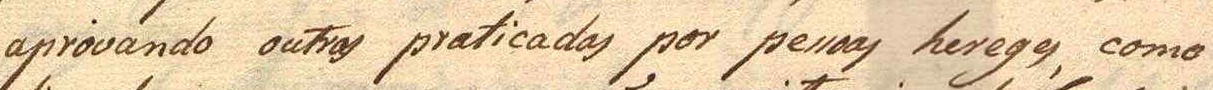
aprovando outras praticadas por pessoas hereges, como
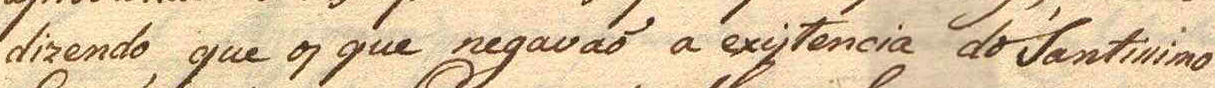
dizendo, que os que negavaõ a existencia do Santissimo
